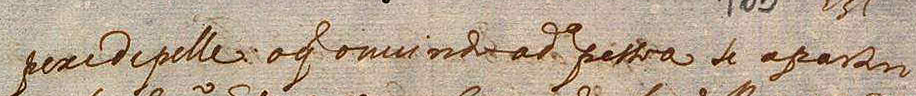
pexe de pelle o q̄ ouuindo a da pessoa se apartou
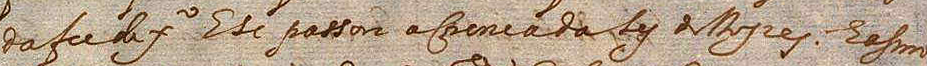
da fee de xo E se passou a Crença da lej de Mojzes. E asim
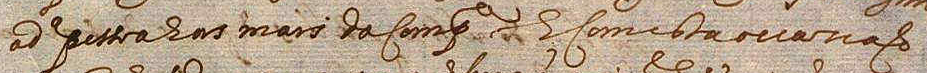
a da pessoa E as mais da Compa E Com esta occaziaõ
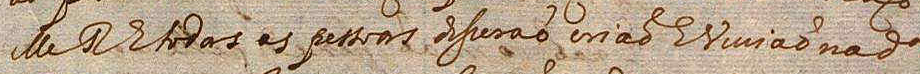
elle R E todas as pessoas disseraõ criaõ E Viuiaõ na da
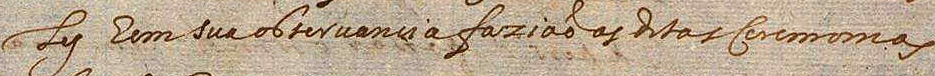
Lej E em sua obseruancia faziaõ as ditas Ceremonias
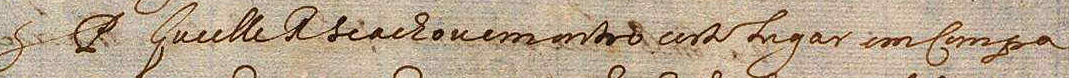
5 P Que elle R se achou em outro certo lugar em Compa
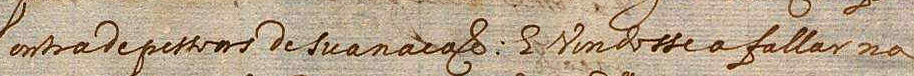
outra de pessoas de sua naçaõ: E Vindosse a fallar na
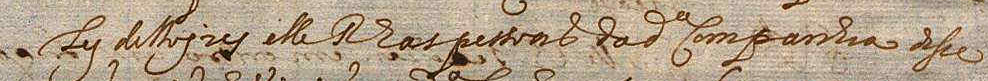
Lej de Mojzes elle R E as pessoas da da Companhia disse
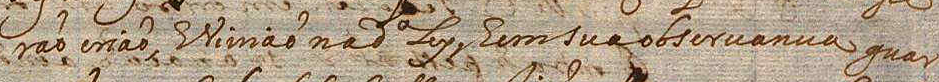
raõ criaõ, E Viuiaõ na da Ley, E em sua obseruancia guar
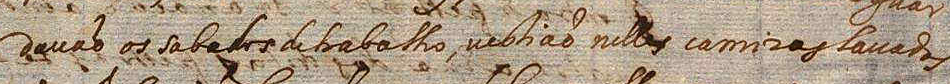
dauaõ os sabados de trabalho, uestiaõ nelles camizas lauadas
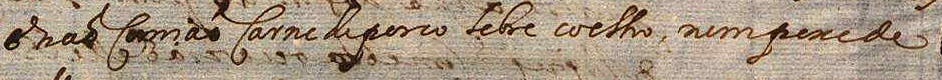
e naõ Comiaõ Carne de porco lebre coelho, nem pexe de
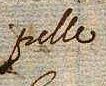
pelle
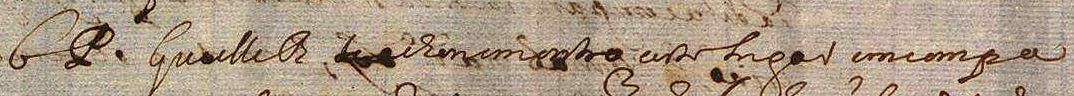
6 P. Que elle R se achou em outro certo lugar em compa
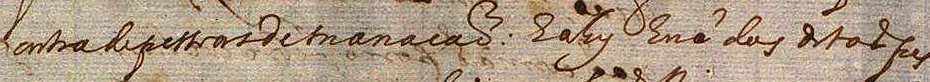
outra de pessoas de sua naçaõ: E ahy huā das ditas pes
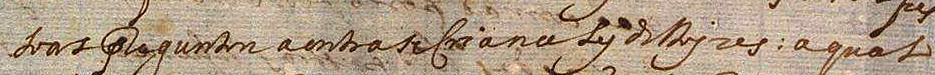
soas preguntou a outra se Cria na Lej de Mojzes: a qual
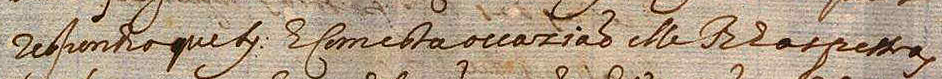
respondeo que sy. E Com esta occaziaõ elle R E as pessoas
